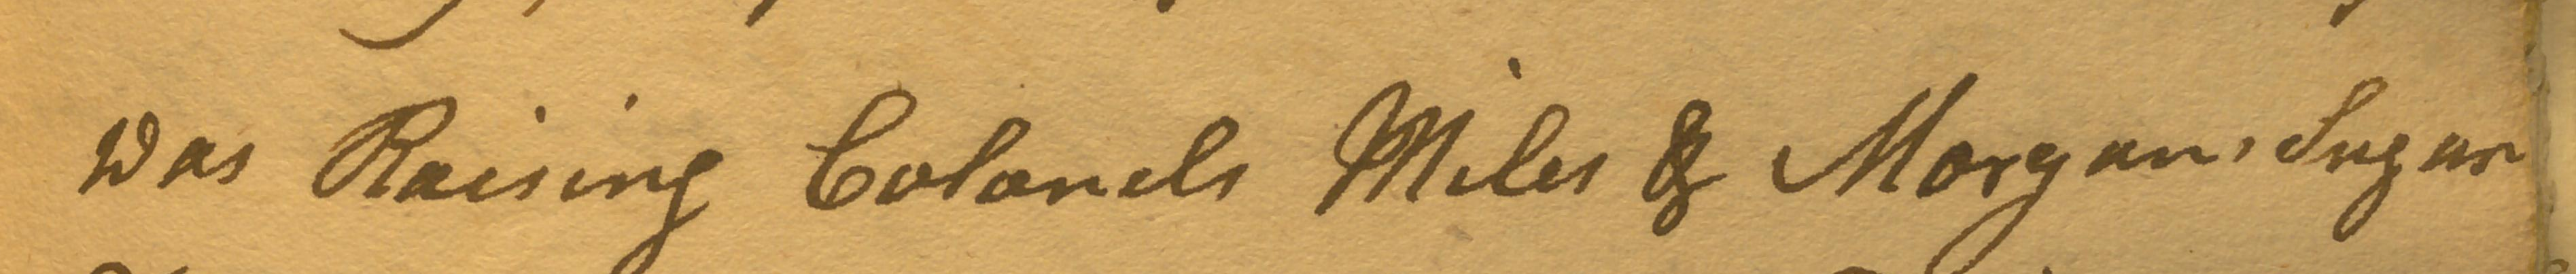was Raising Colanels Miles & Morgans Sugar
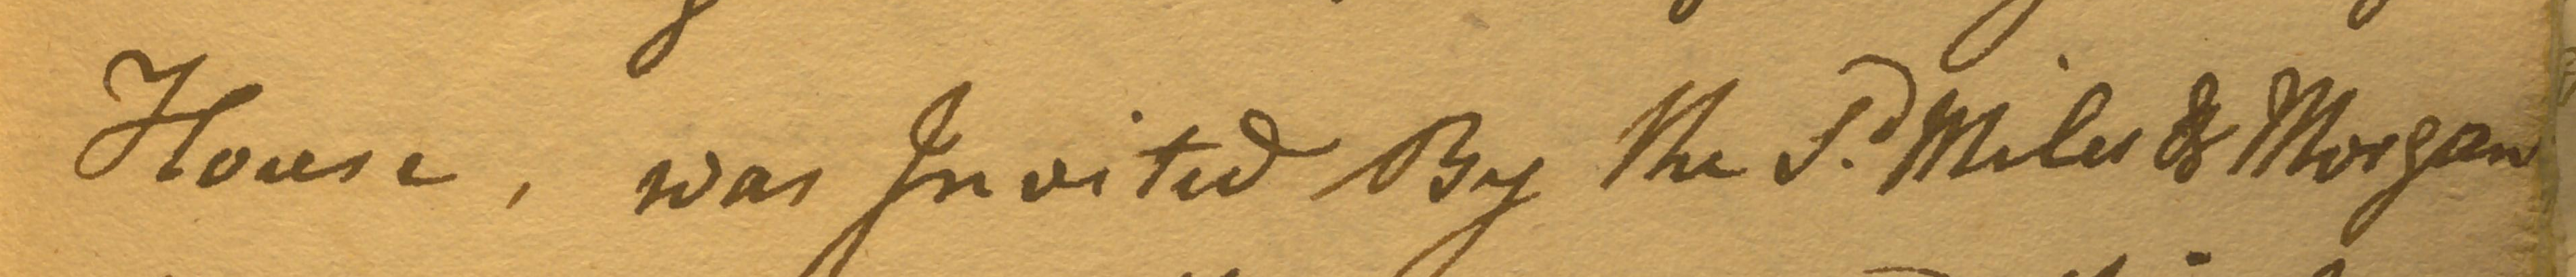House, was Invited By the s^d. Miles & Morgan
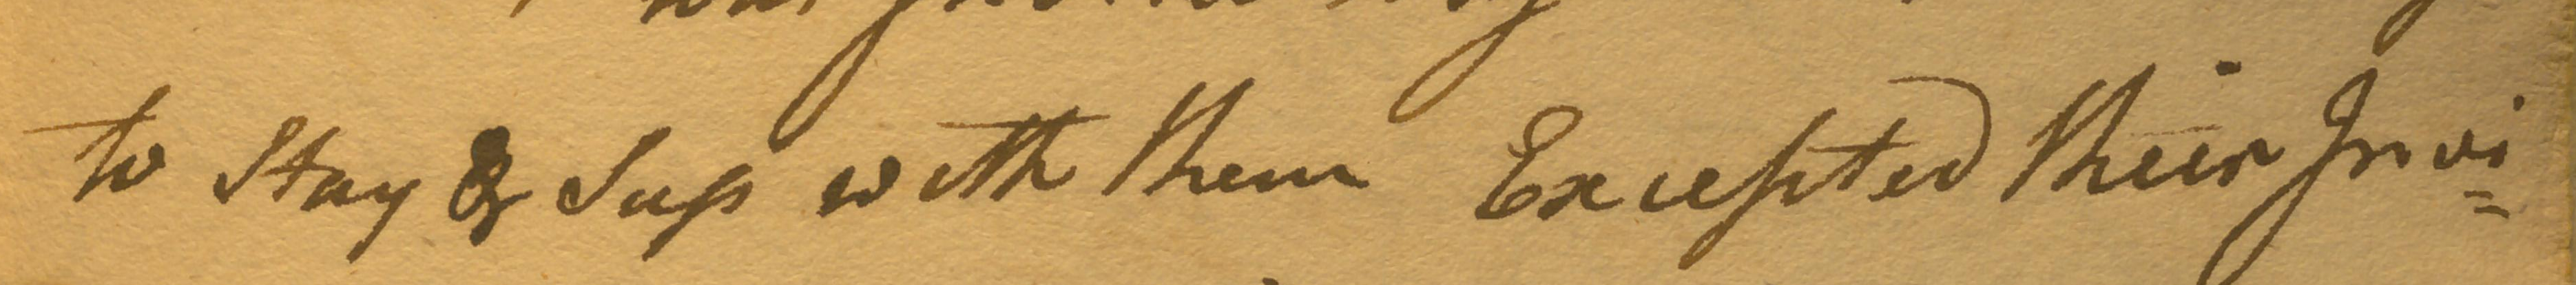to Stay & Sup with them Excepted their Invi-
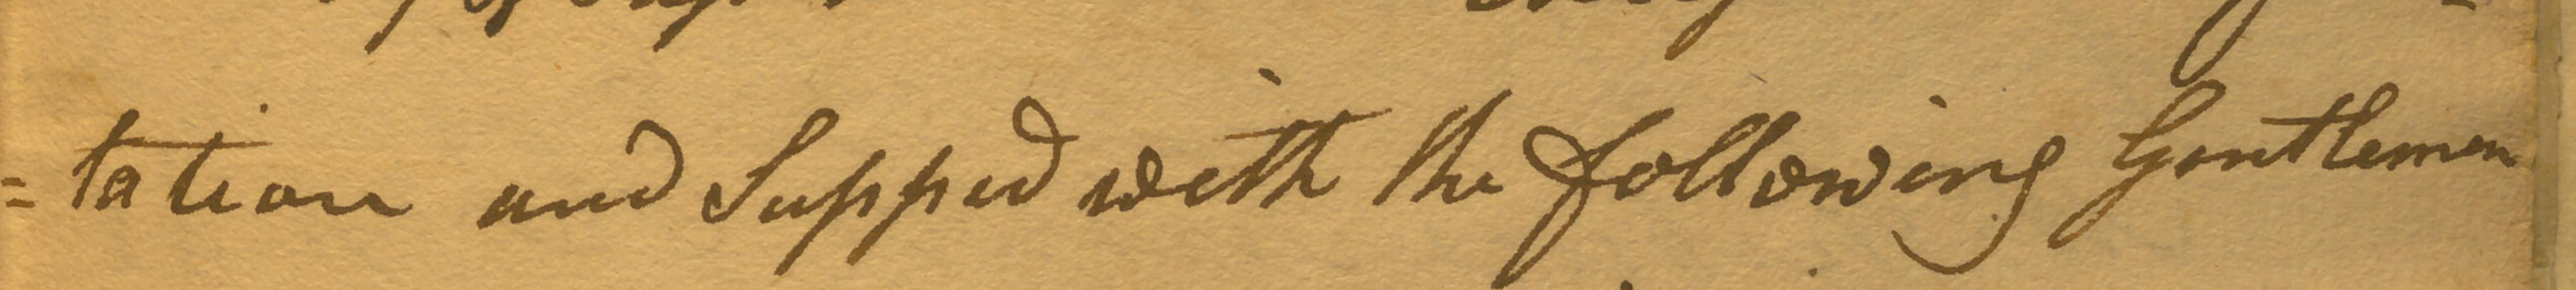tation and Supped with the following Gentlemen
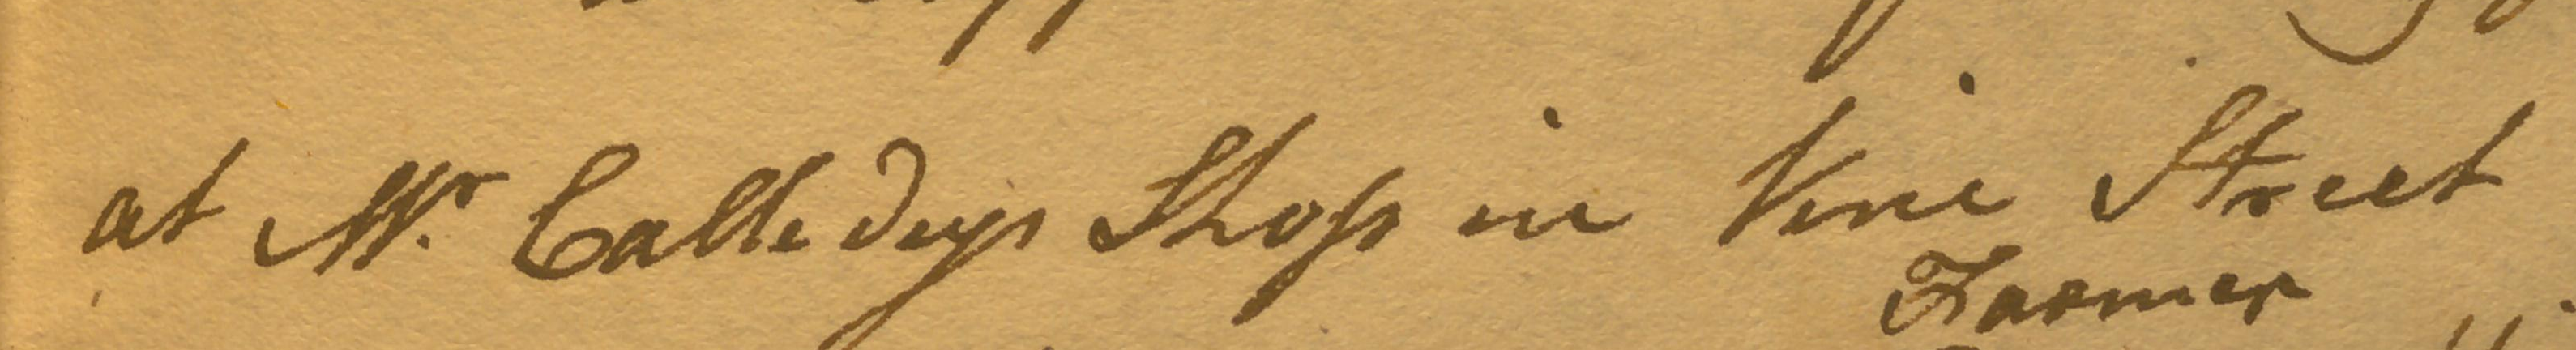at M^r. Calledeys Shop in Vine Street
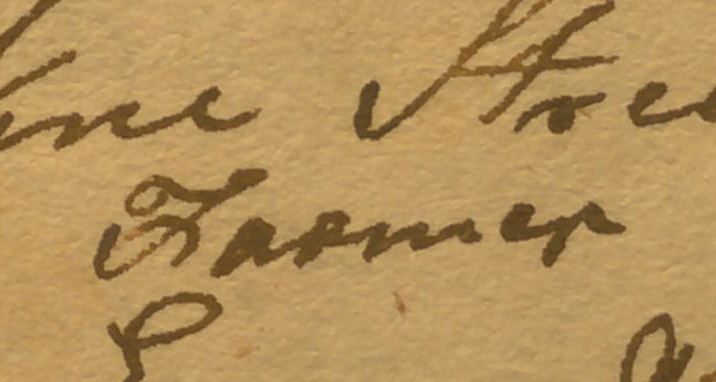Farmer
